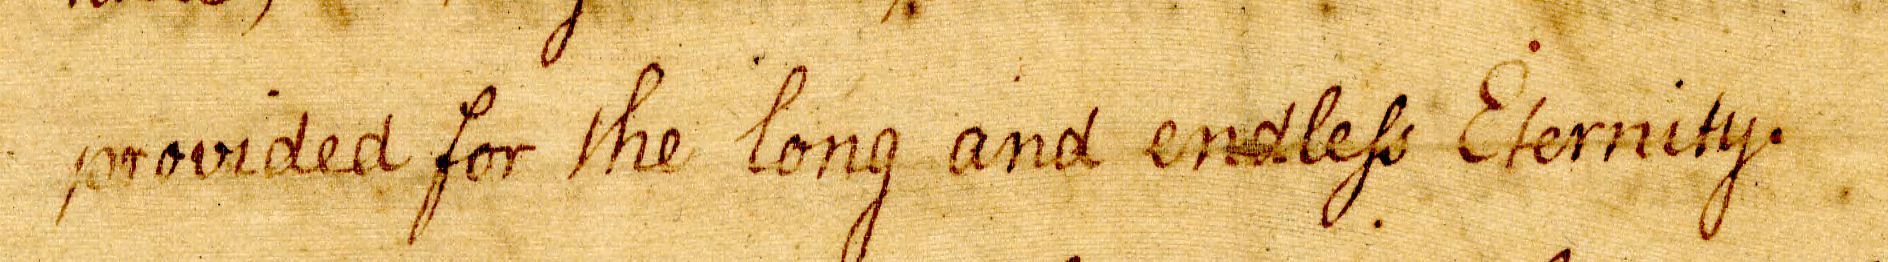provided for the long and endless Eternity.
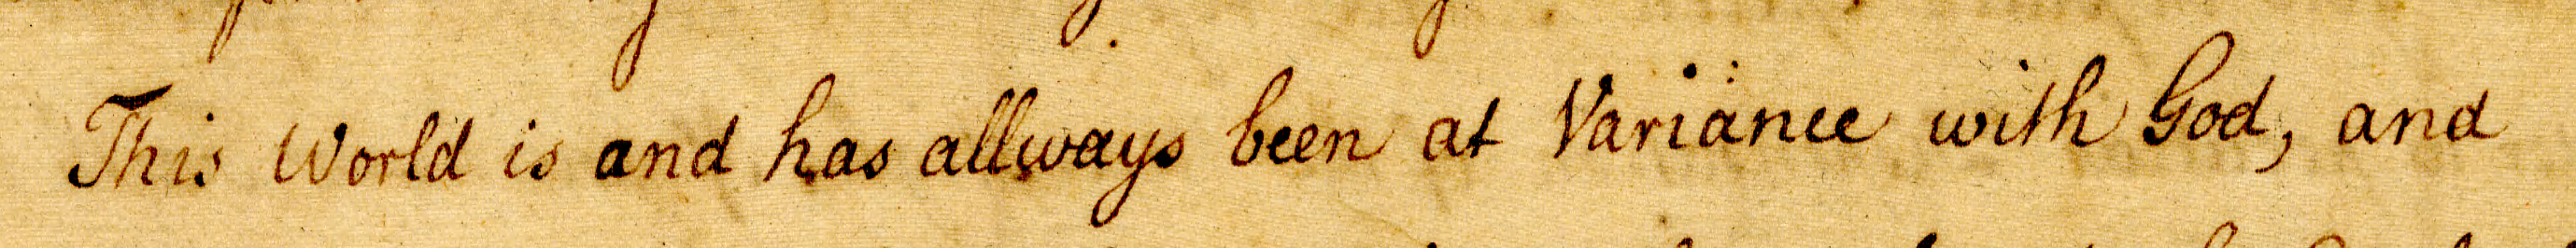This world is and has allways been at Variance with God, and
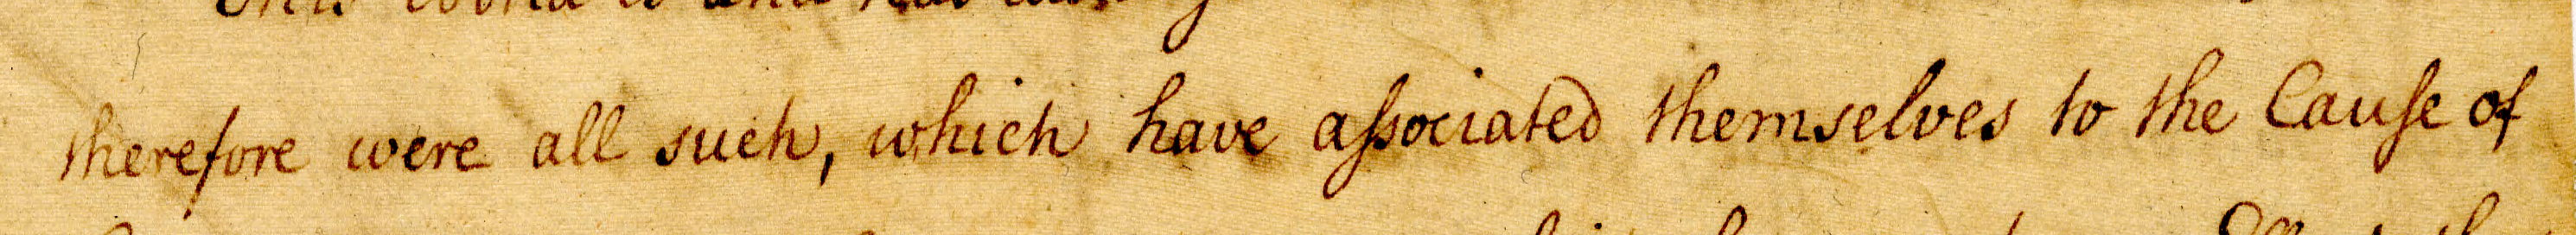therefore were all such, which have associated themselves to the cause of
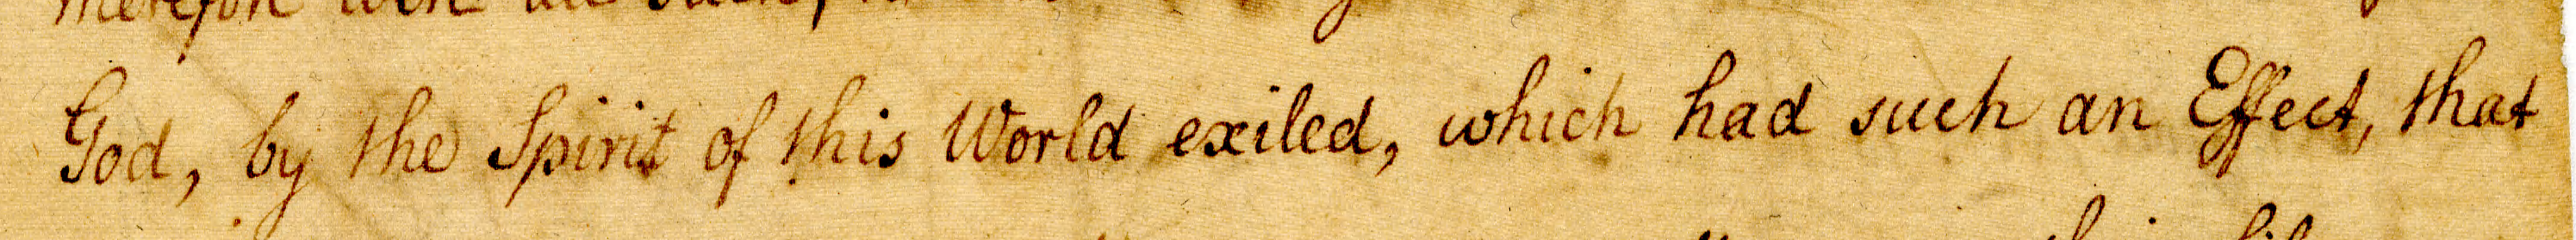God, by the Spirit of this world exiled, which had such an Effect, that
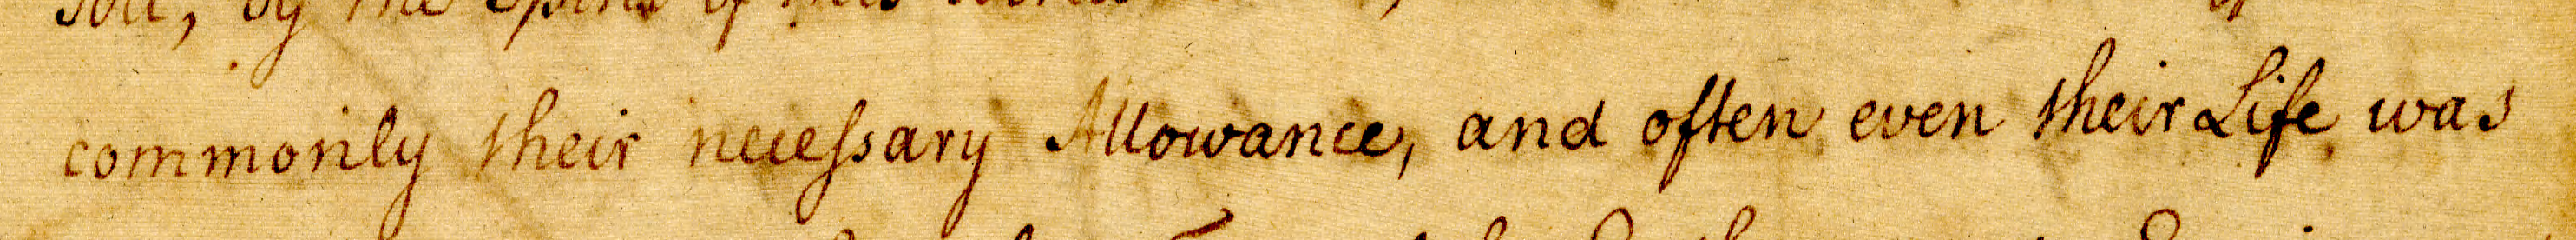commonly their necessary Allowance, and offer even their Life was
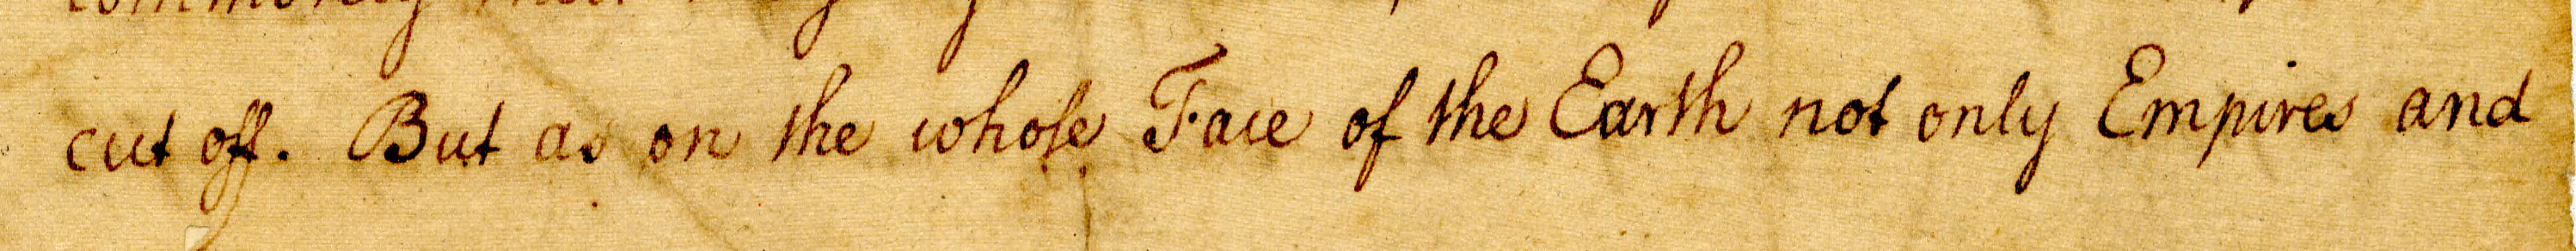cut off. But as on the whole Face of the Earth not only Empires and
